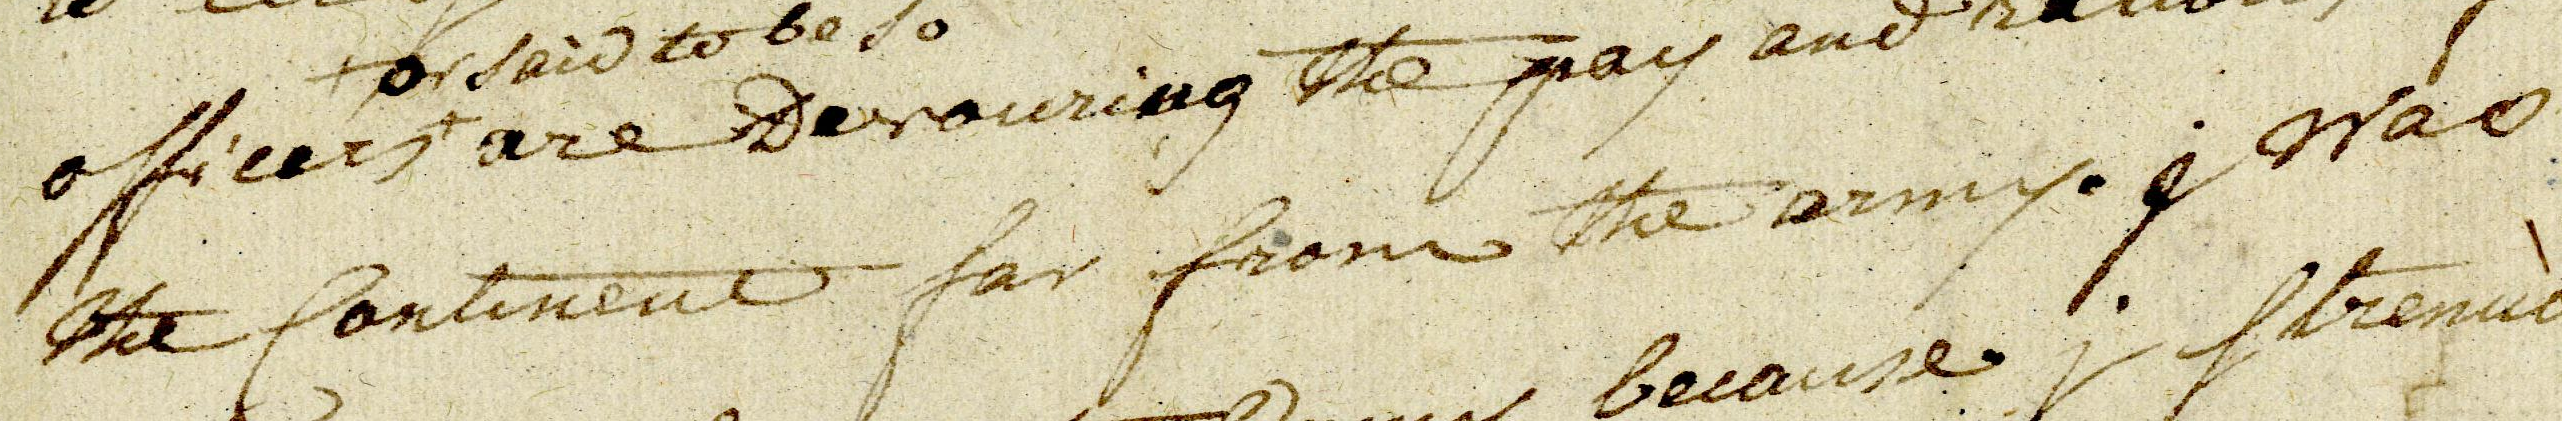the Continent far from the Army. I Was
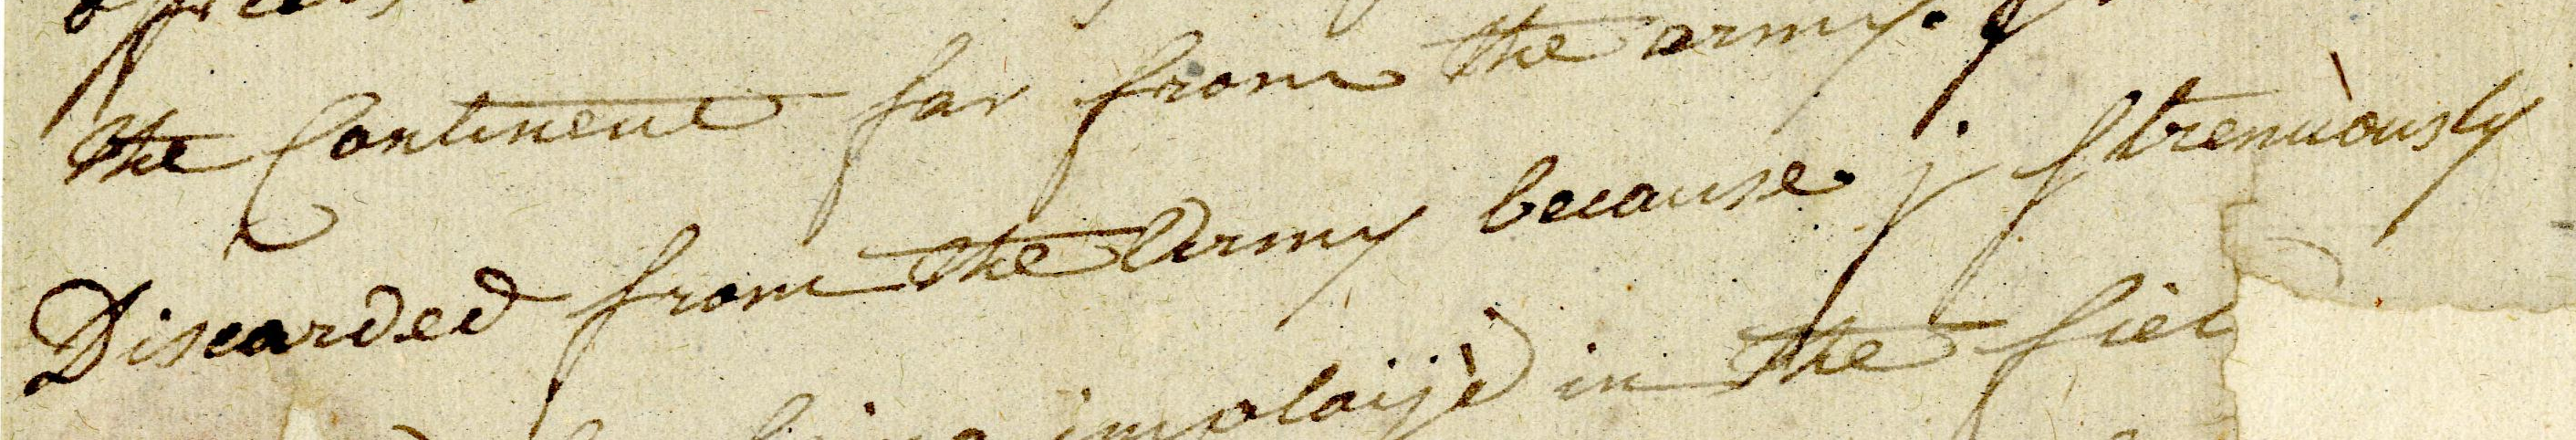Discarded from the Army because I Strenuously
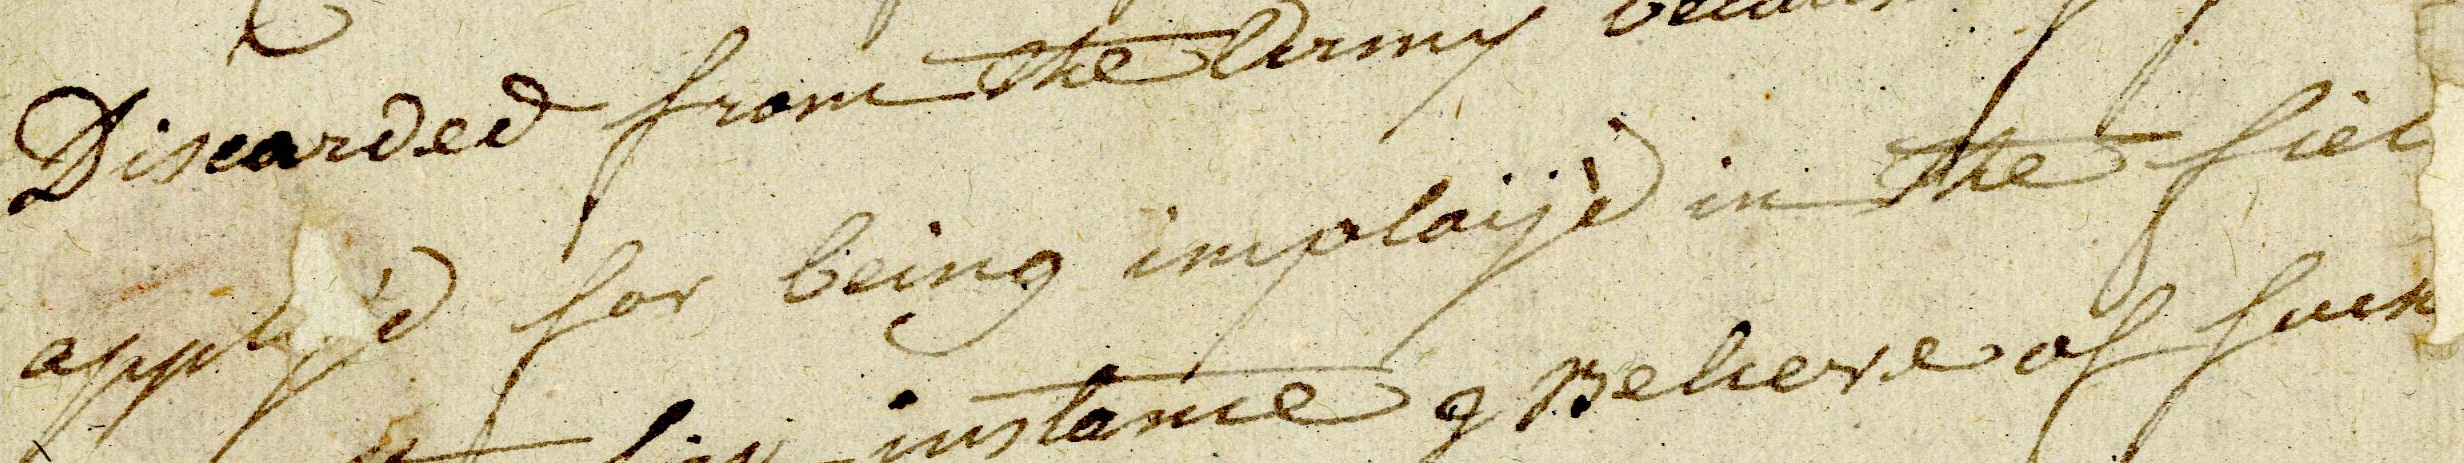apply'd for being imploy'd in the fiel
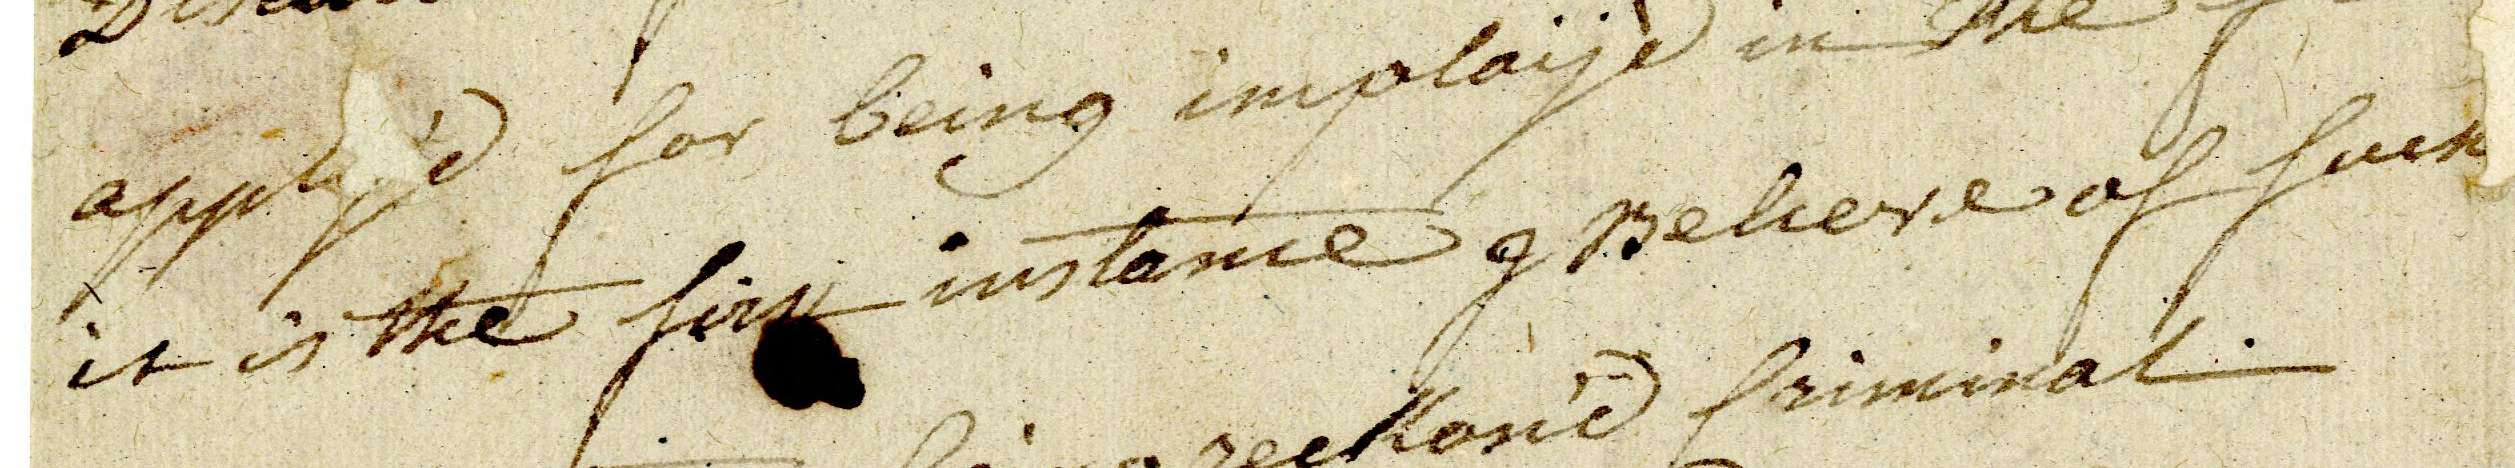it is the first instance I Believe of such
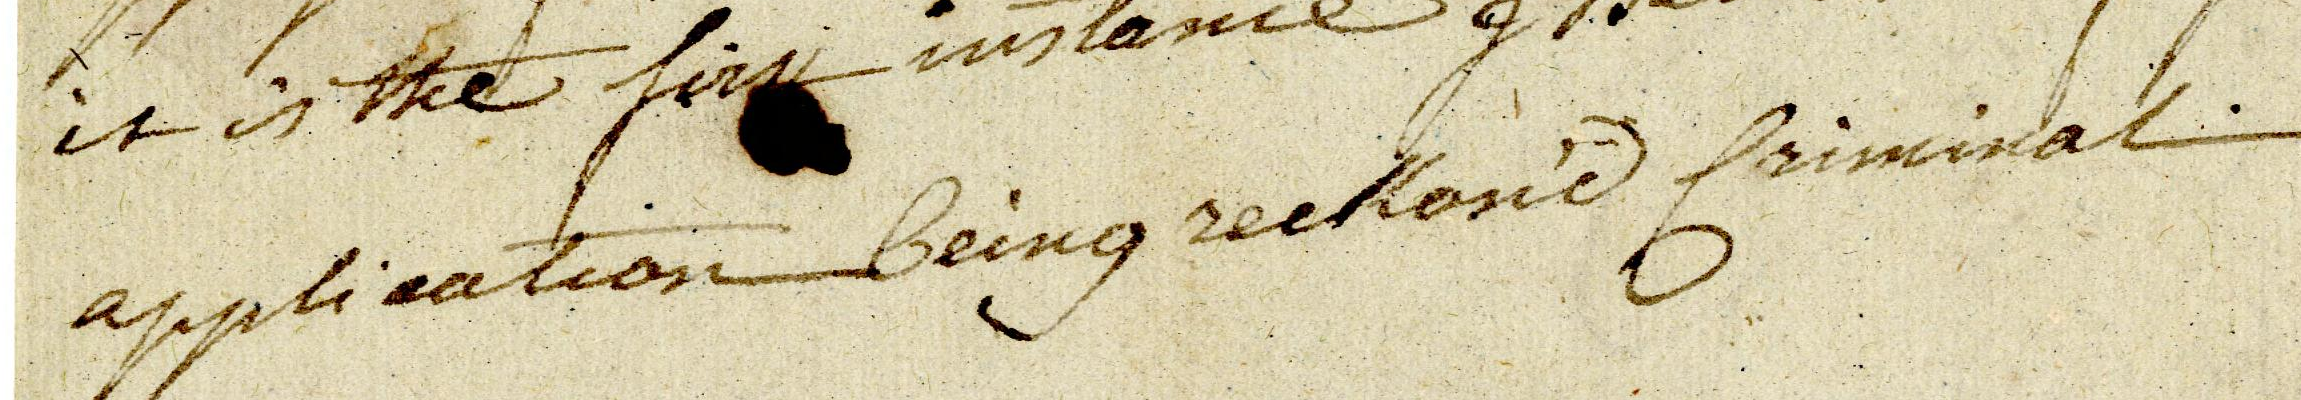application being reckon'd Criminal
